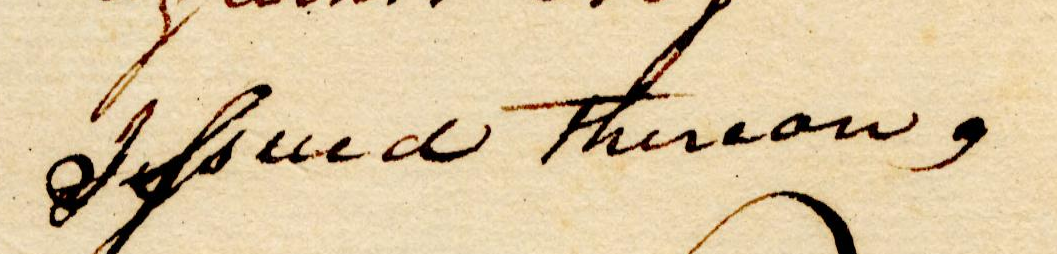Issued thereon,
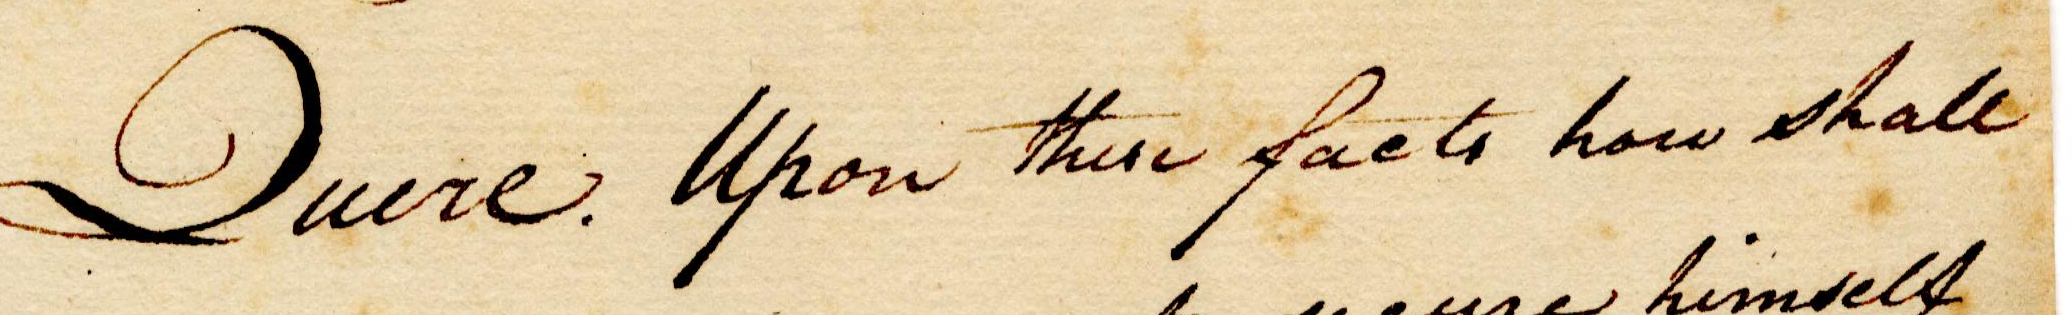Quere, Upon these facts how shall
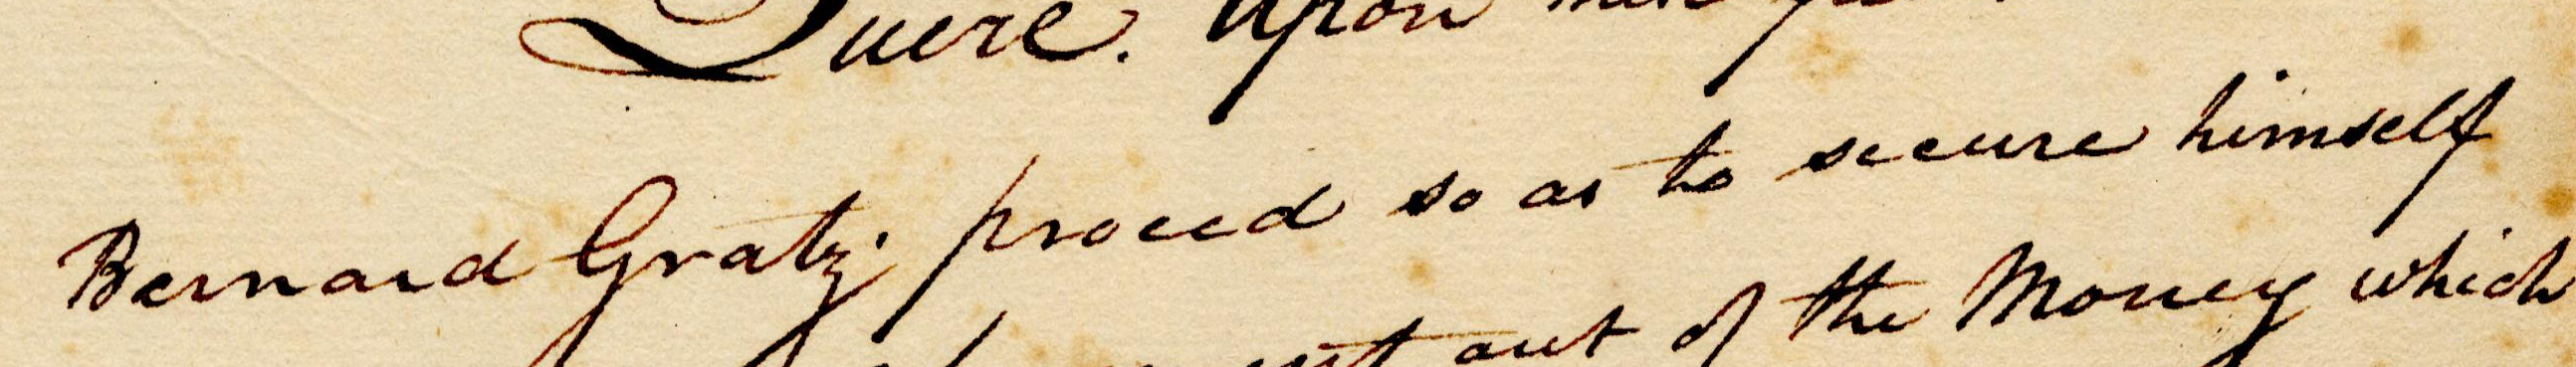Bernard Gratz. proced so as to secure himself
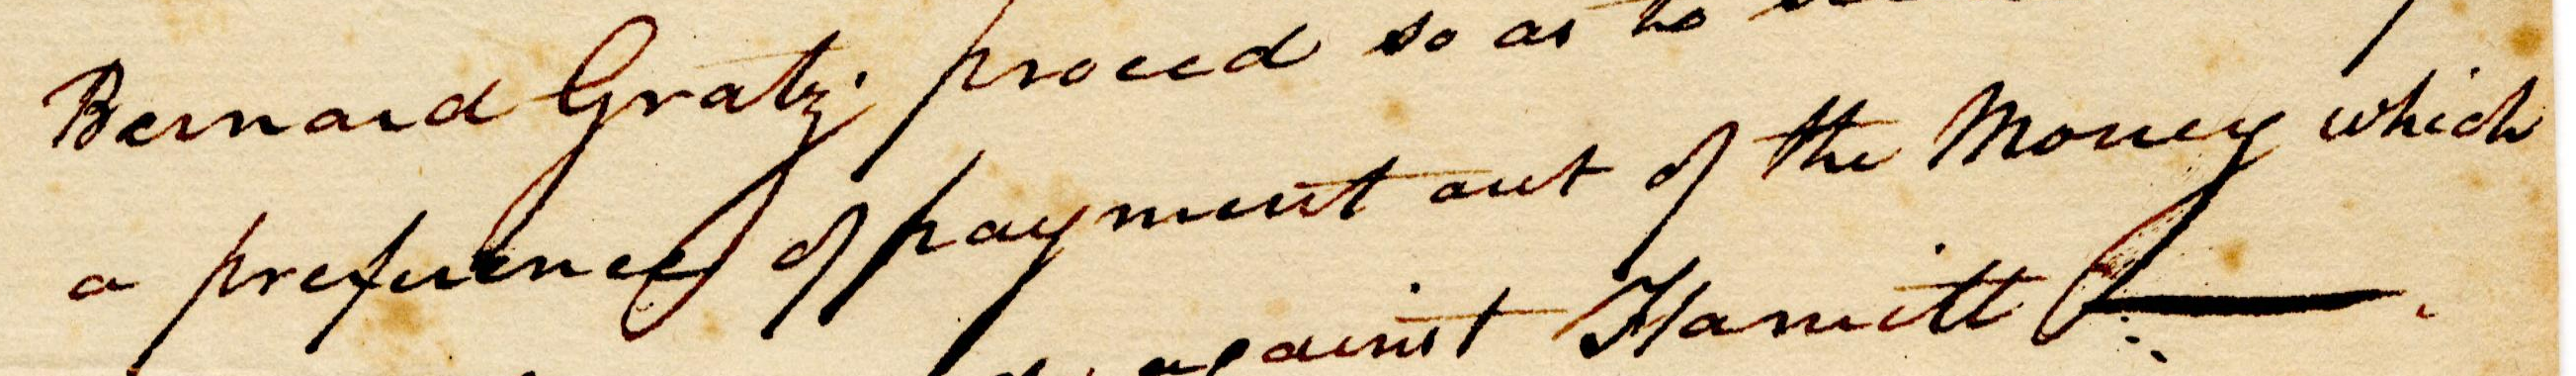a preference of payment out of the money which
